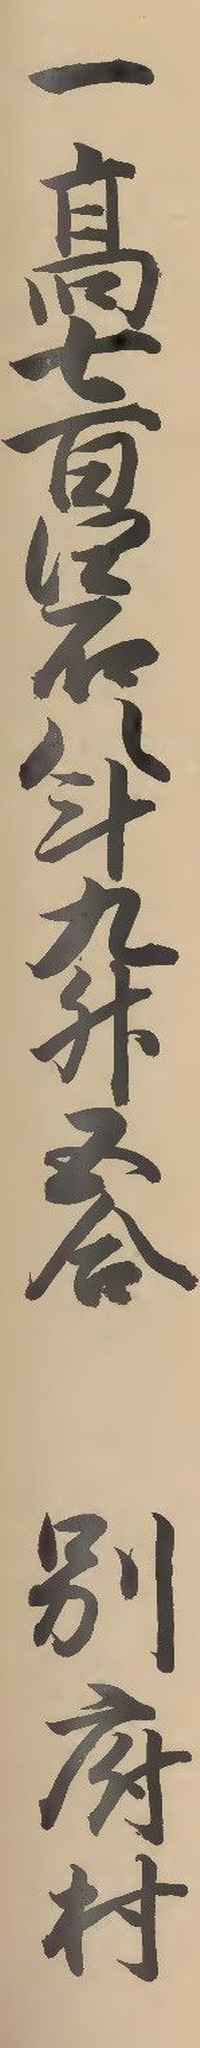一髙七百四石八斗九升五合別府村
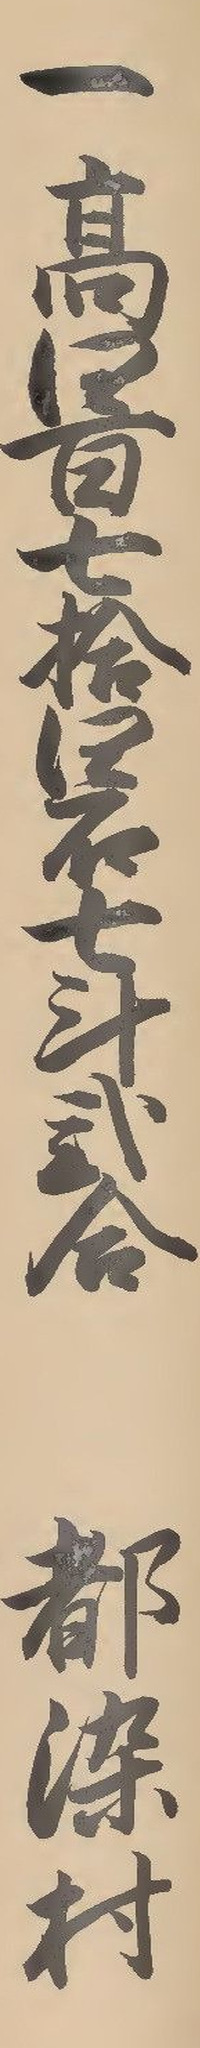一髙四百七拾四石七斗弐合都染村
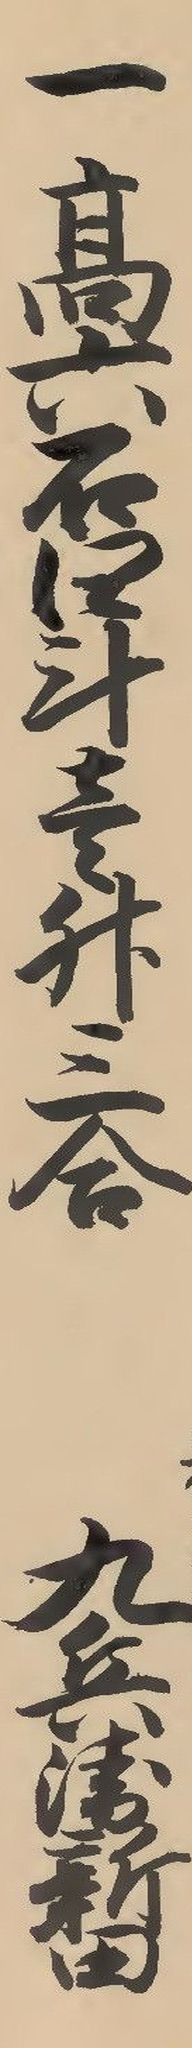一髙六石四斗壱升三合九兵衛新田
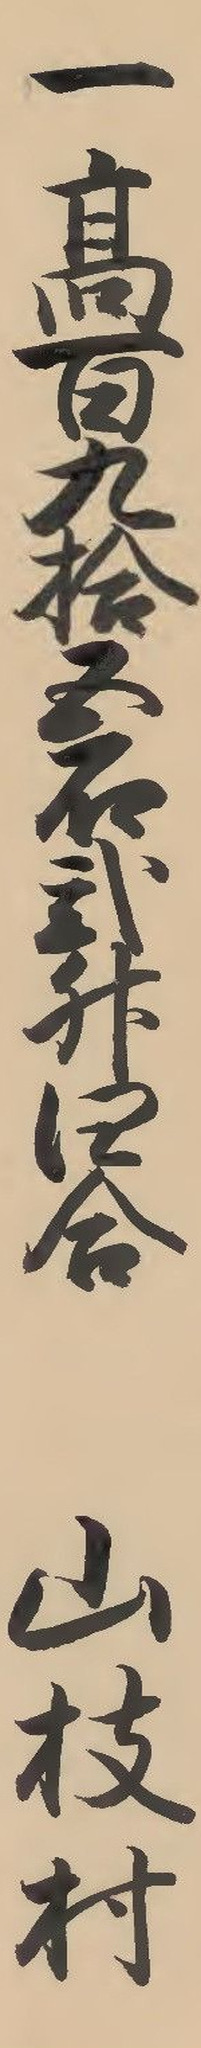一髙百九拾五石弐升四合山枝村
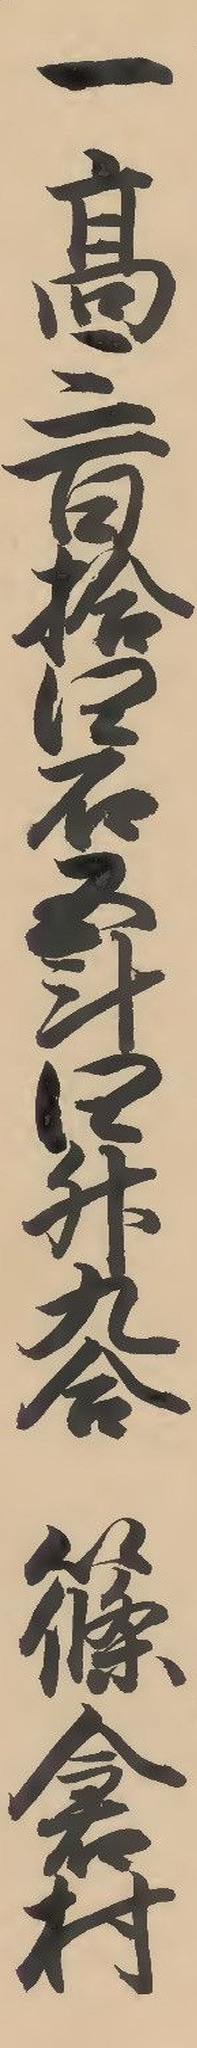一髙三百拾四石五斗四升九合篠倉村

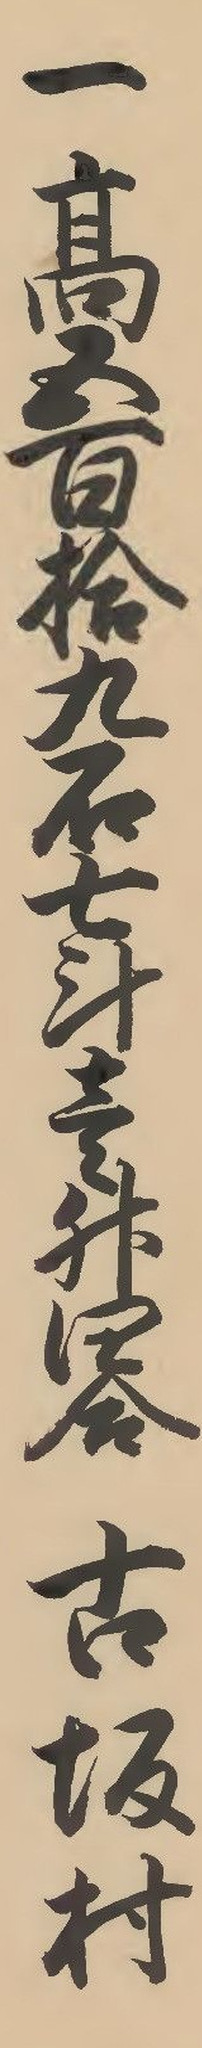一髙五百拾九石七斗壱升四合古坂村
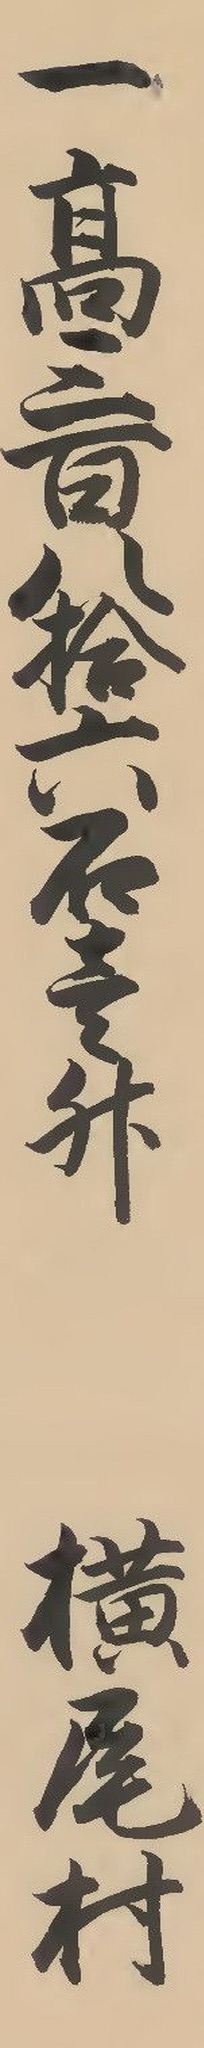一髙三百八拾六石壱升横尾村
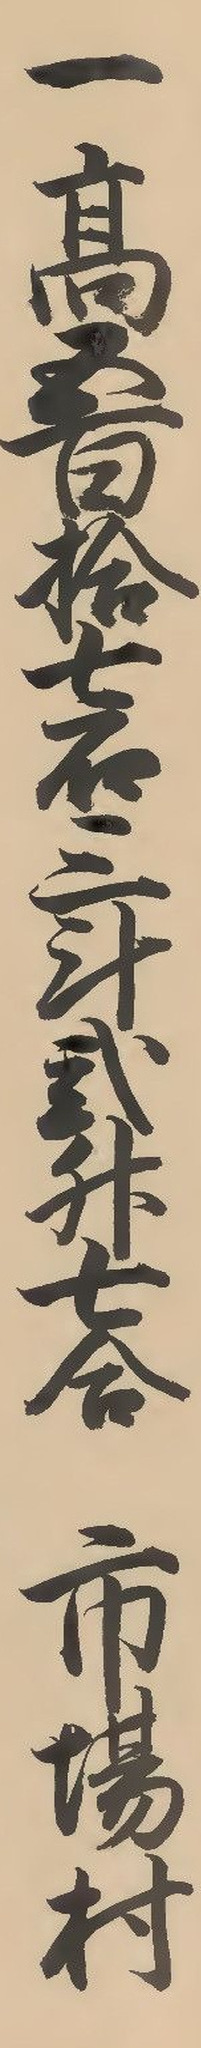一髙五百拾七石三斗弐升七合市場村
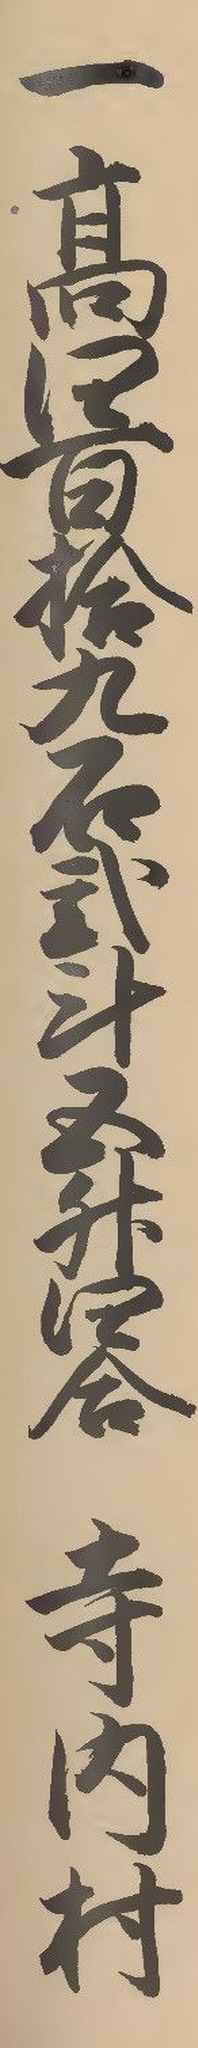一髙四百拾九石弐斗五升四合寺内村
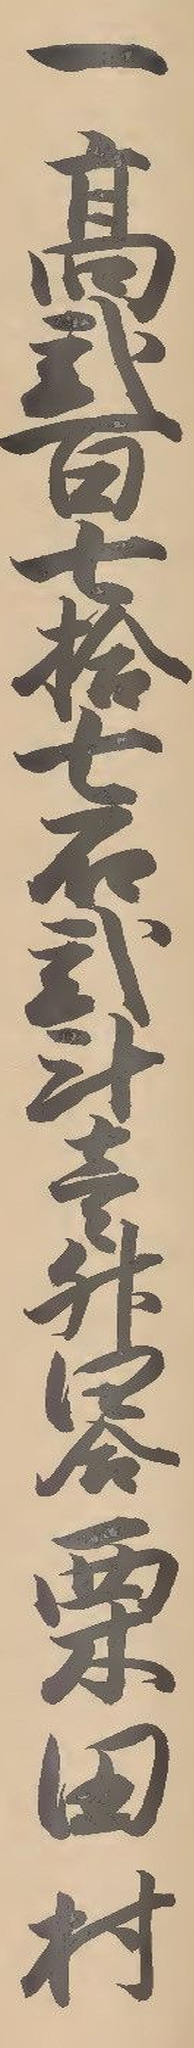一髙弐百七拾七石弐斗壱升四合栗田村
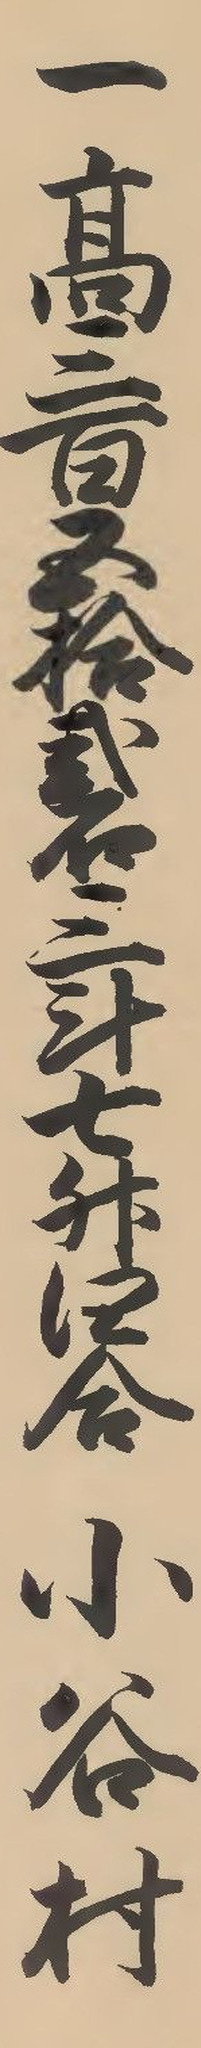一髙三百五拾弐石三斗七升四合小谷村
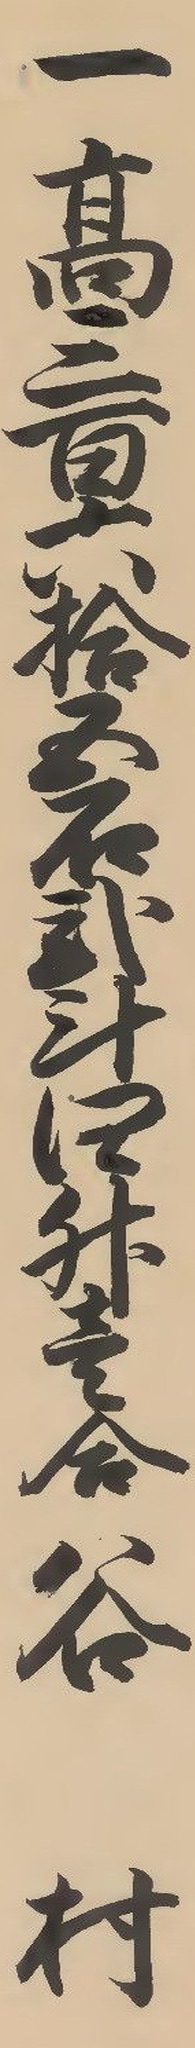一髙三百六拾五石弐斗四升壱合谷村
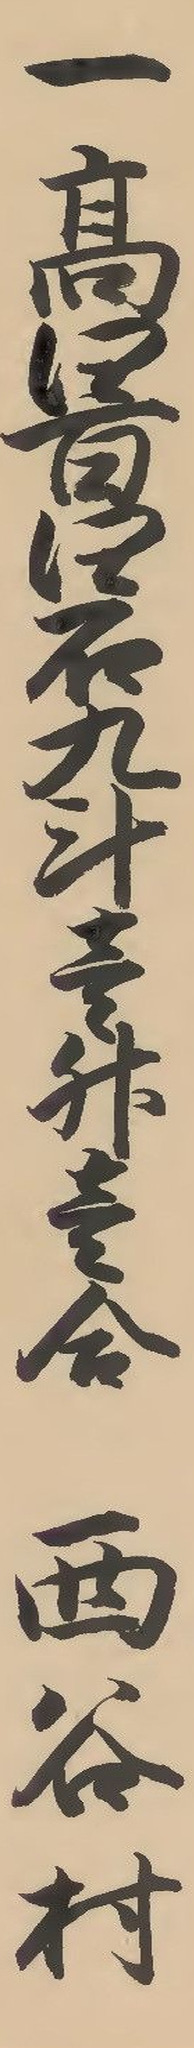一髙四百四石九斗壱升壱合西谷村

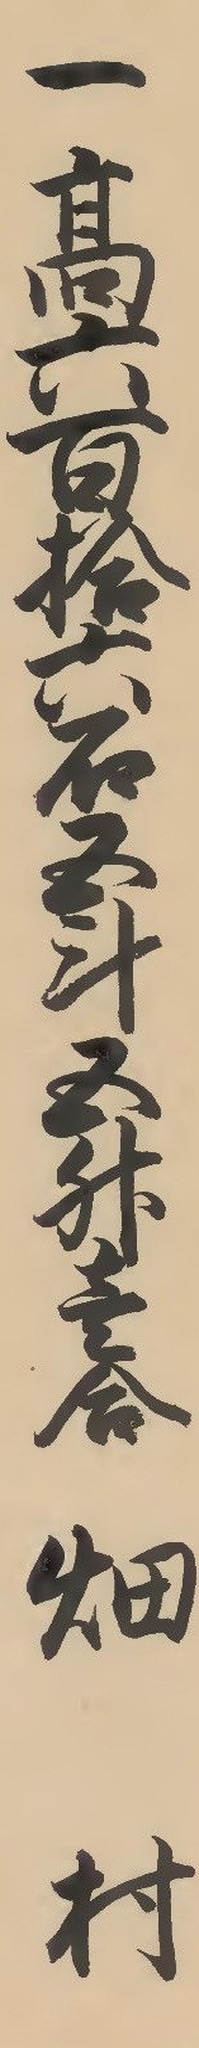一髙六百拾六石五斗五升壱合畑村
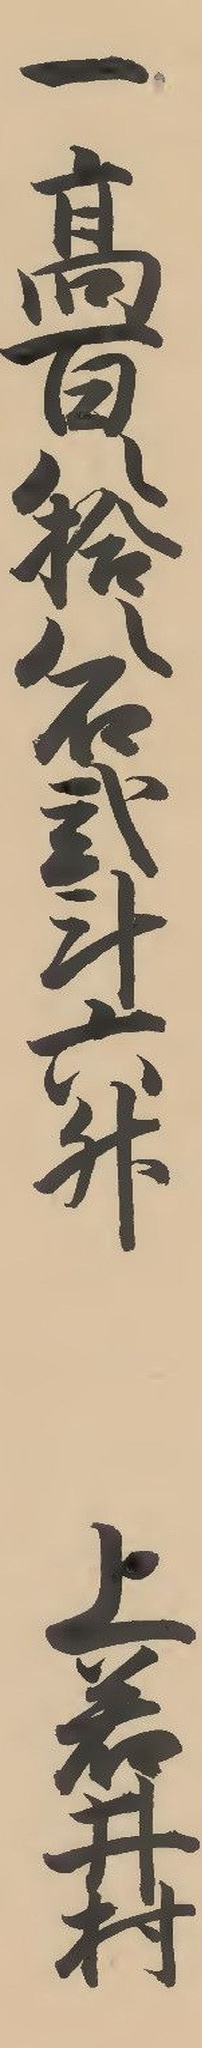一髙百八拾八石弐斗六升上若井村
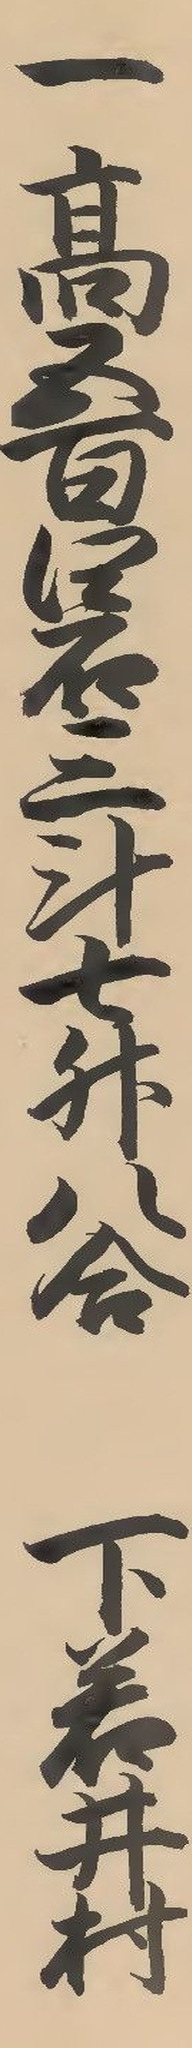一髙五百四石三斗七升八合下若井村
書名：播磨国郷帳
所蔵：国立公文書館 National Archives of Japan
